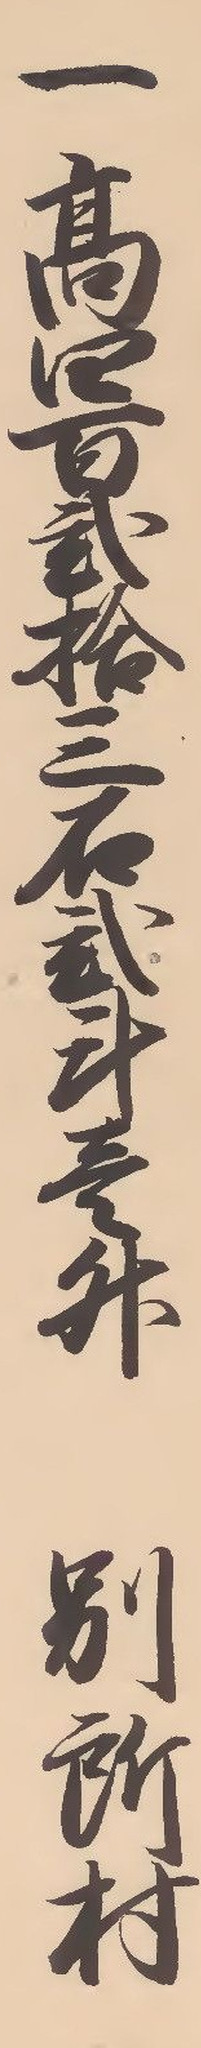一高四百弐拾三石弐斗壱升別所村
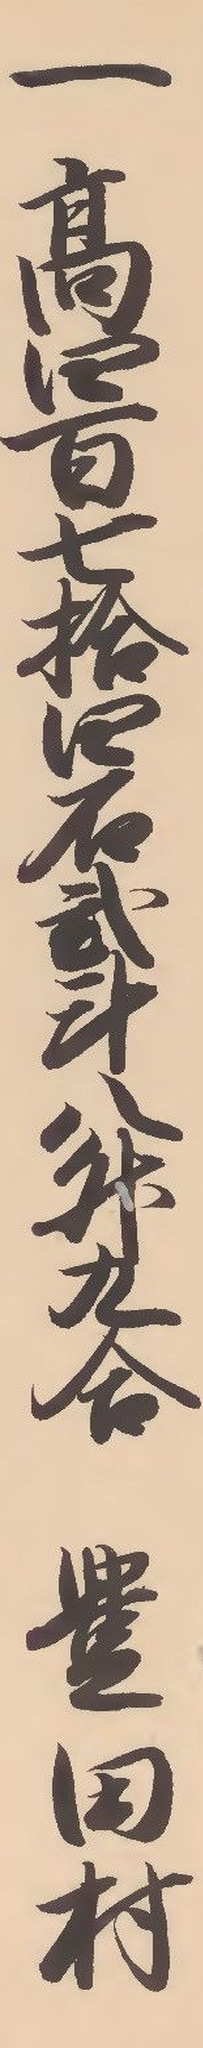一高四百七拾四石弐斗八升九合豊田村
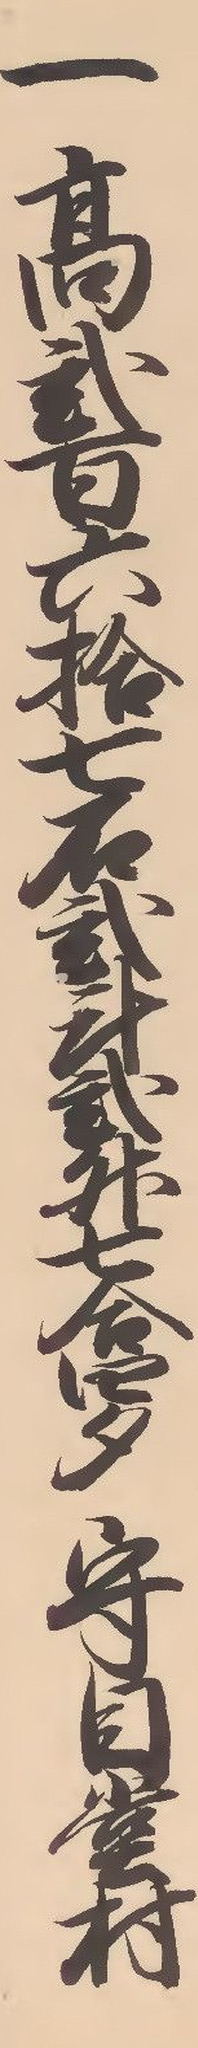一高弐百六拾七石弐斗弐升七合四勺守目堂村
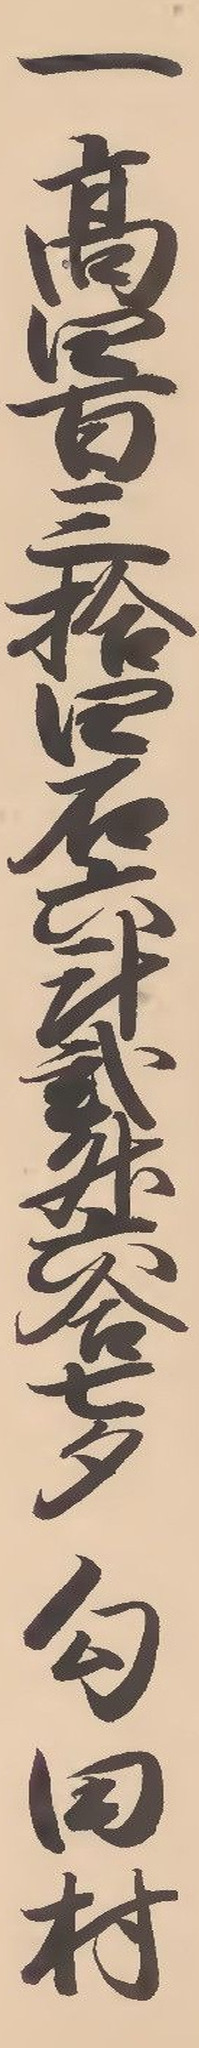一高四百三拾四石六斗弐升六合七勺勾田村
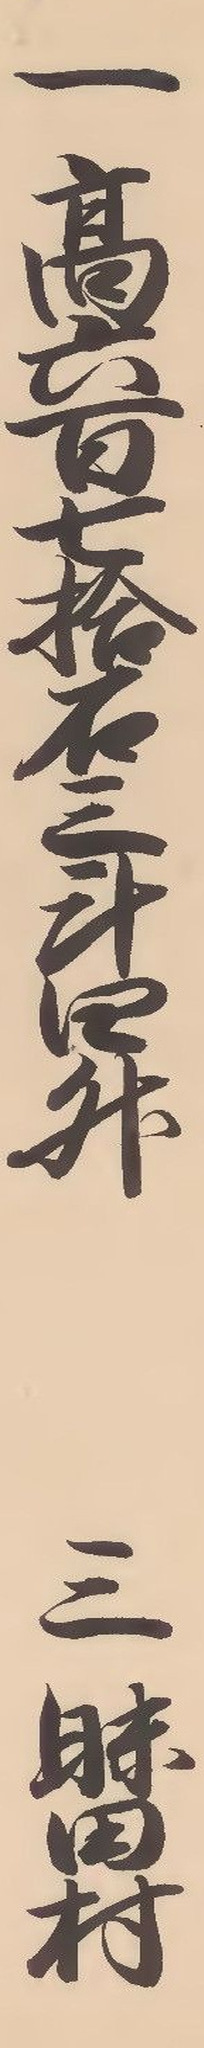一高六百七拾石三斗四升三昧田村
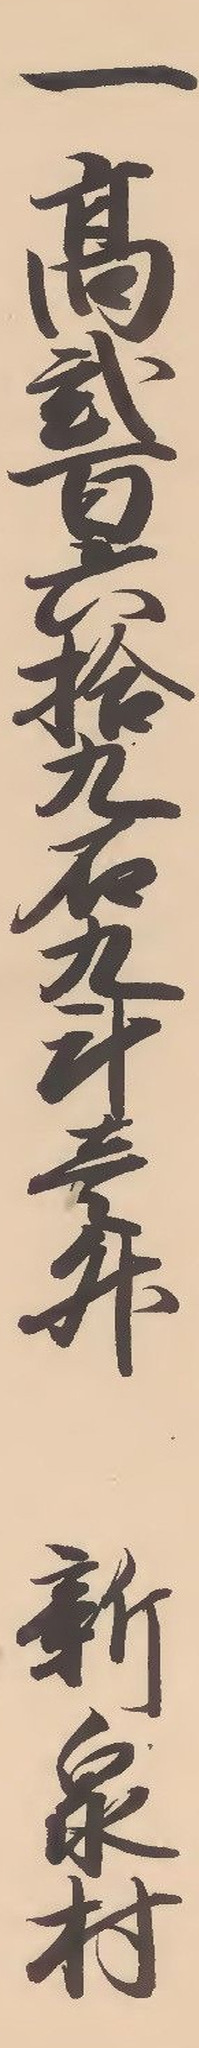一高弐百六拾九石九斗壱升新泉村
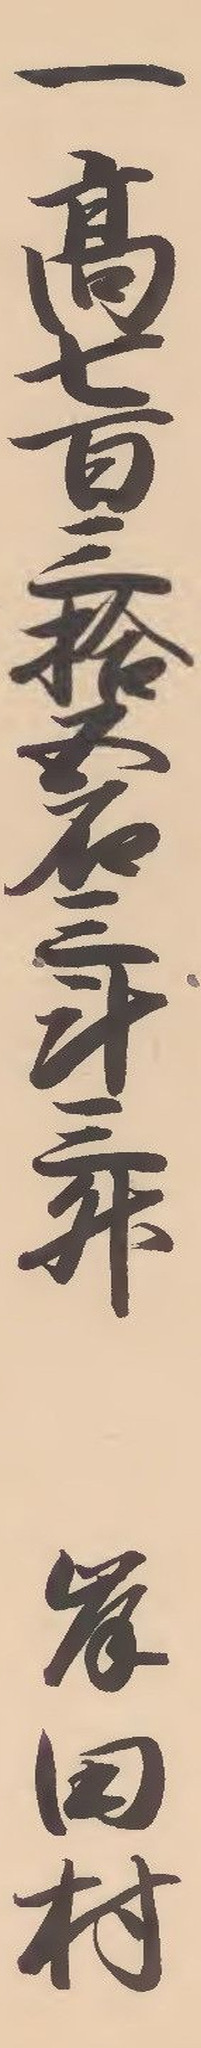一高七百三拾五石三斗三升岸田村

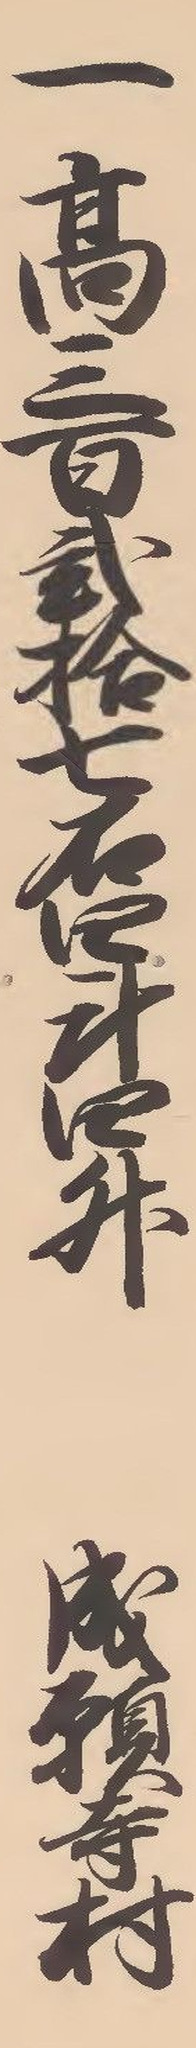一高三百弐拾七石四斗四升成願寺村
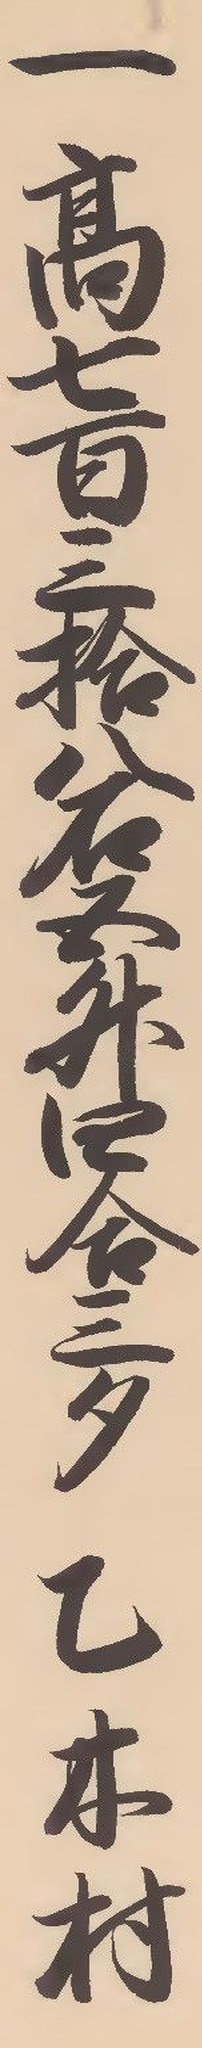一高七百三拾八石五升四合三勺乙木村
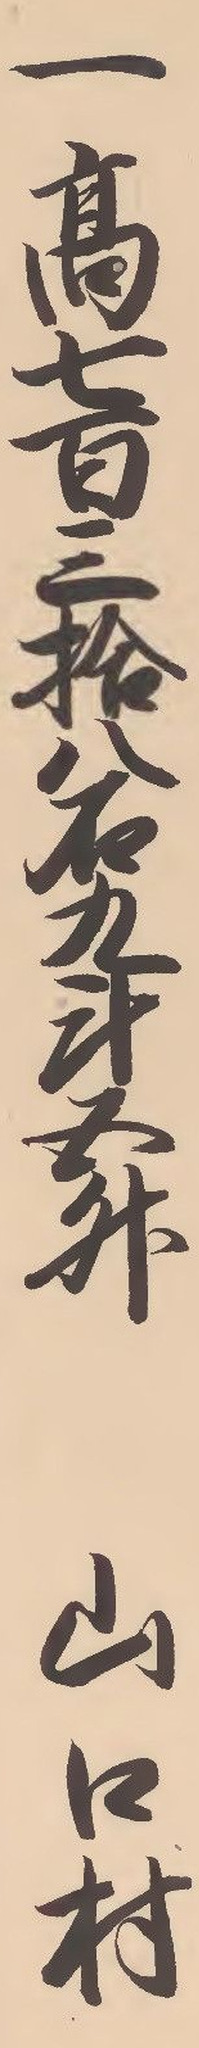一高七百三拾八石九斗五升山口村
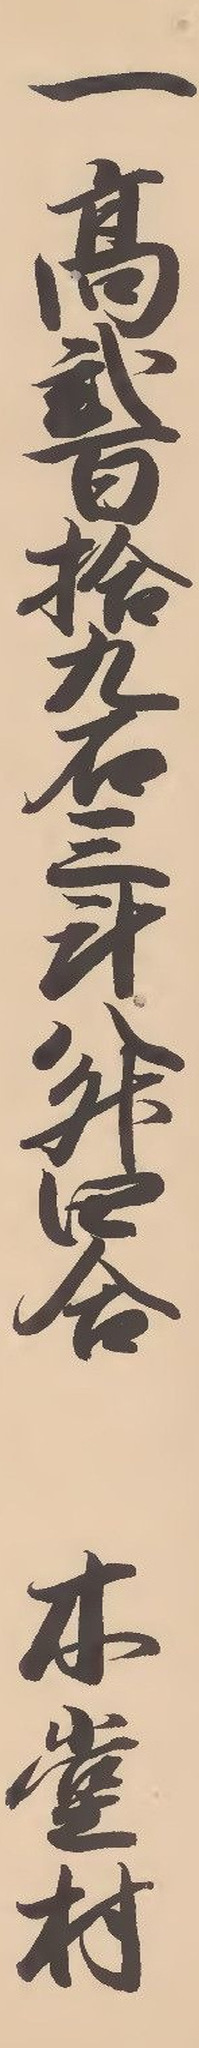一高弐百拾九石三斗八升四合木堂村
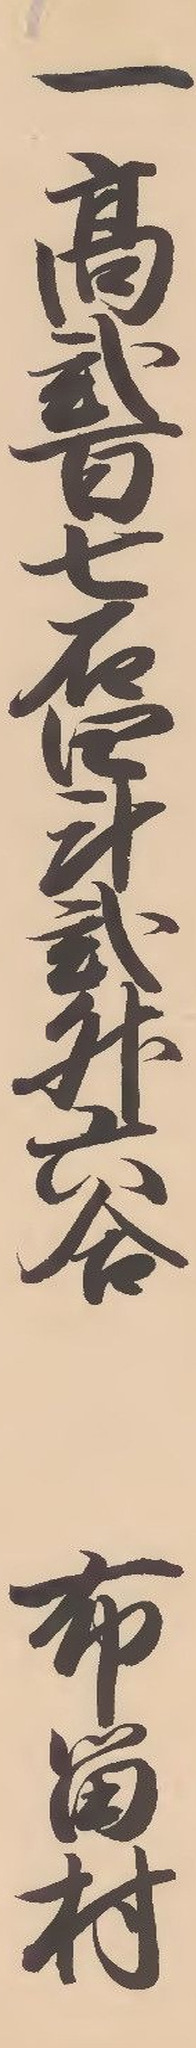一高弐百七石四斗弐升六合布留村
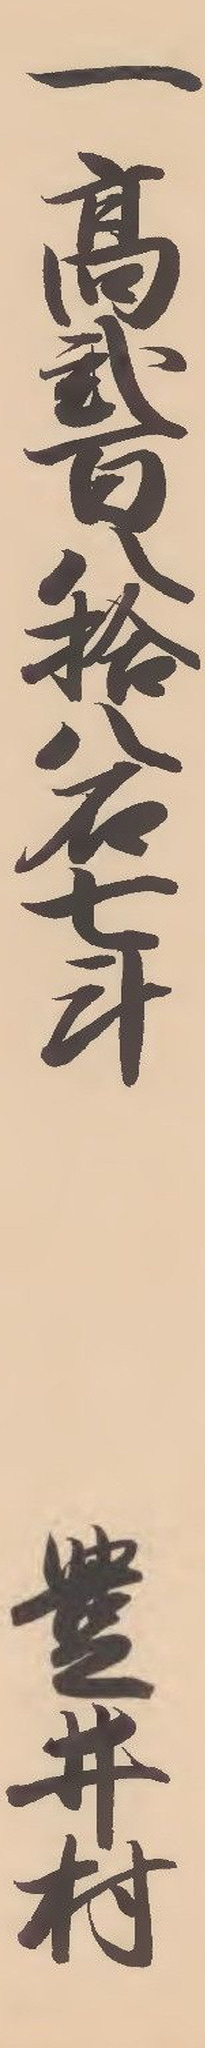一高弐百八拾八石七斗豊井村
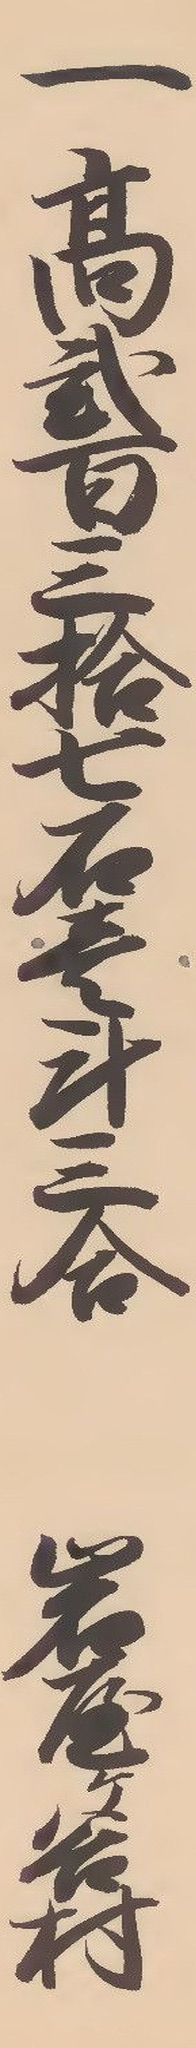一高弐百三拾七石壱斗三合岩屋ヶ谷村

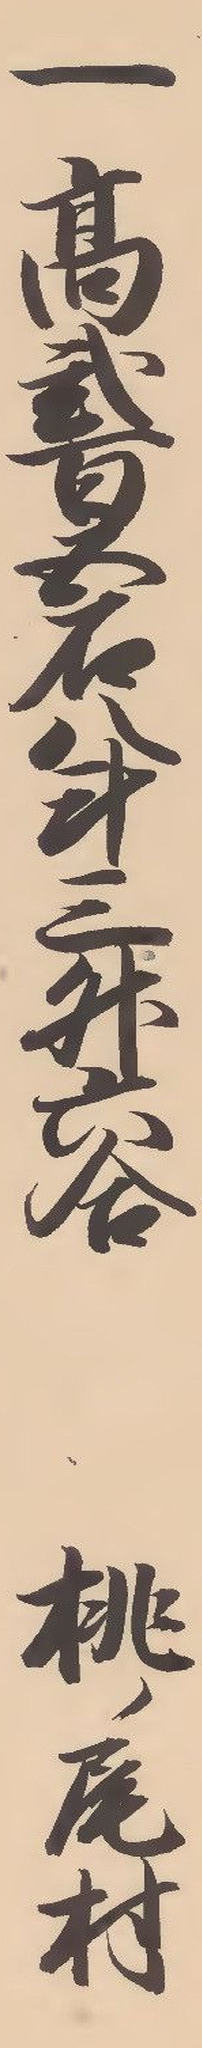一高弐百五石八斗三升六合桃ノ尾村
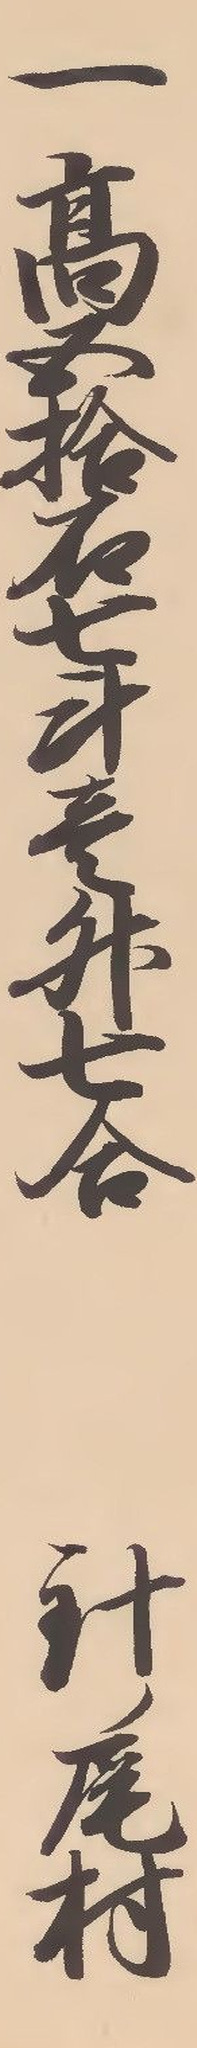一高五拾石七斗壱升七合針ノ尾村
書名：大和国郷帳
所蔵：国立公文書館 National Archives of Japan
